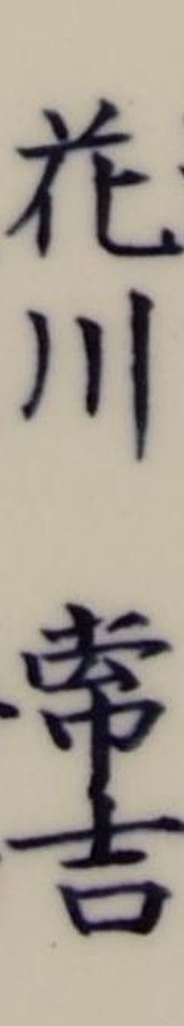花川常吉
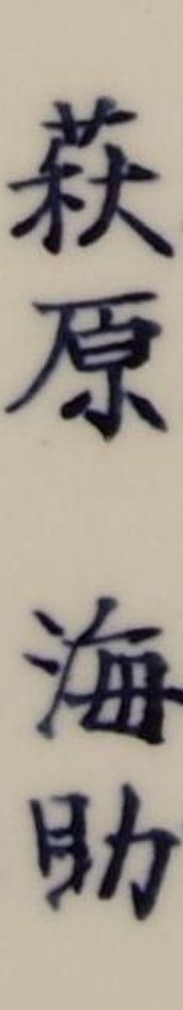萩原海助
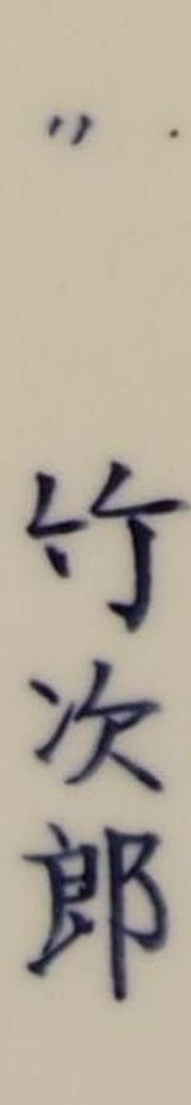竹次郎
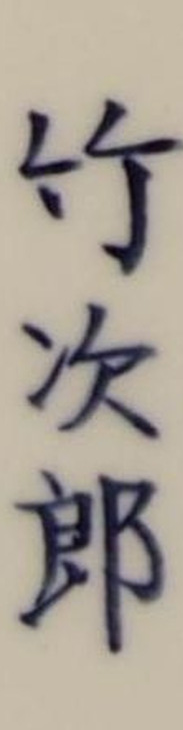竹次郎
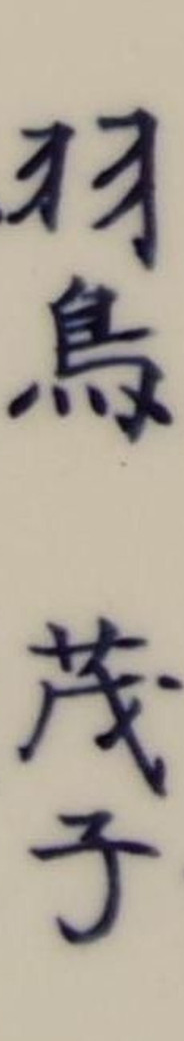羽鳥茂子
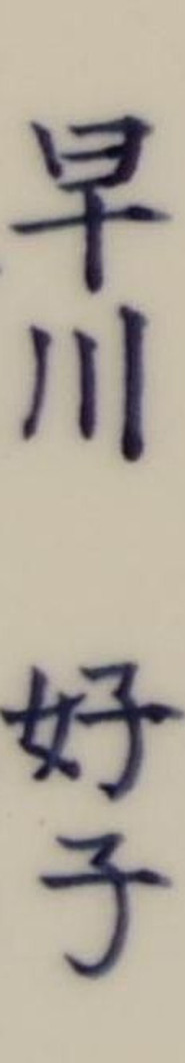早川好子
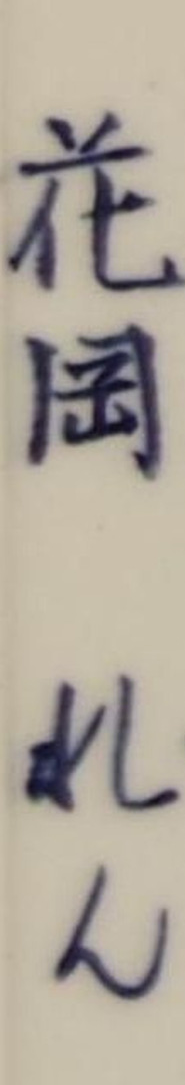花岡れん

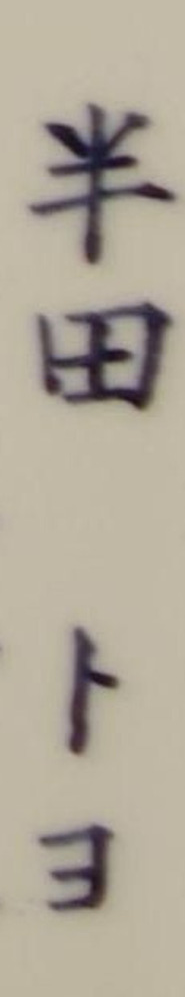半田トヨ
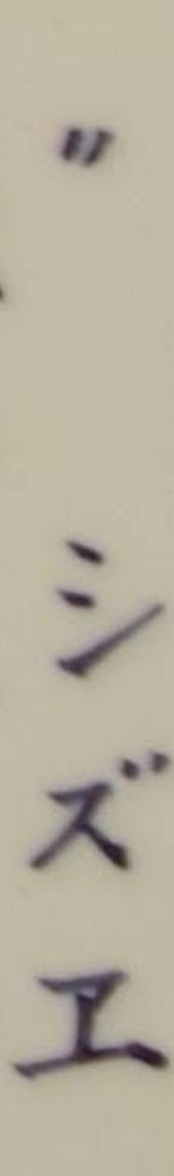シズエ
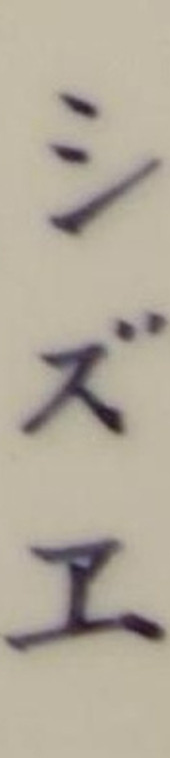シズエ
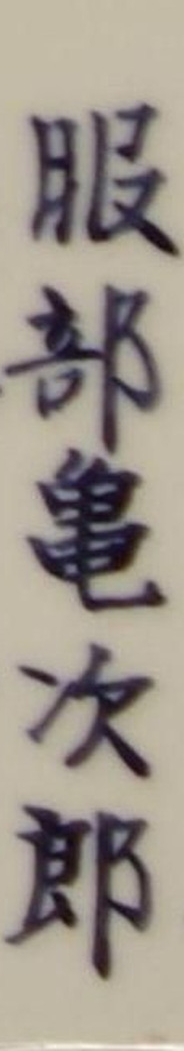服部亀次郎
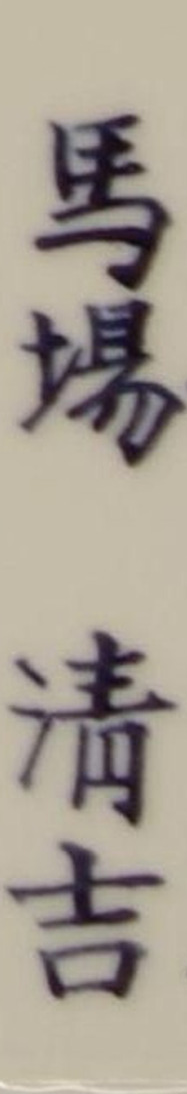馬場清吉
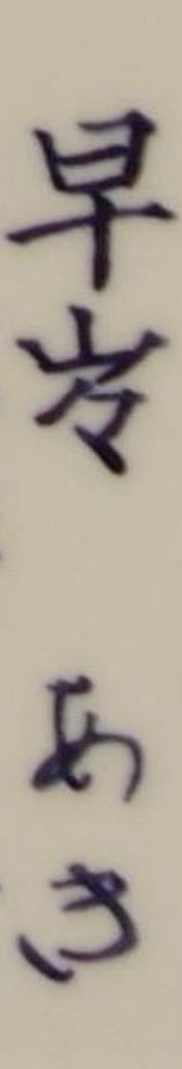早㞮あき
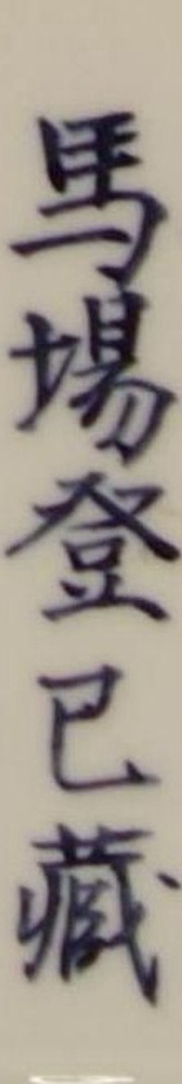馬場登巳蔵
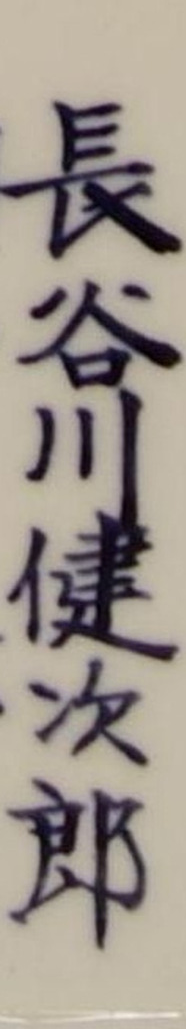長谷川健次郎
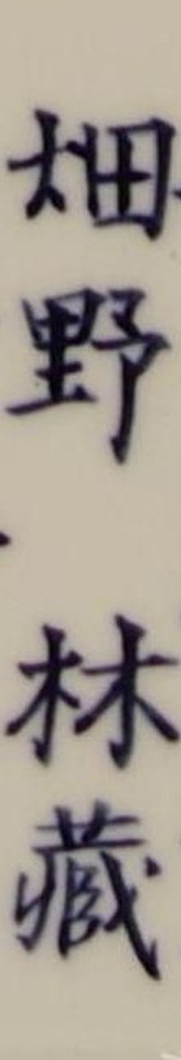畑野林蔵
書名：E~L
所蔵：高野山金剛峯寺
